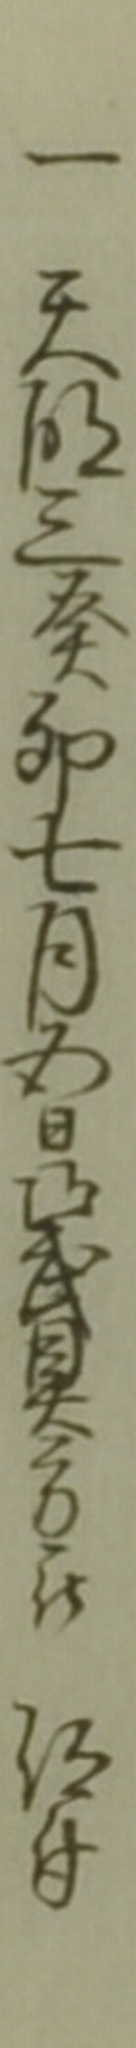一天明三癸卯七月五日御武具方被仰付
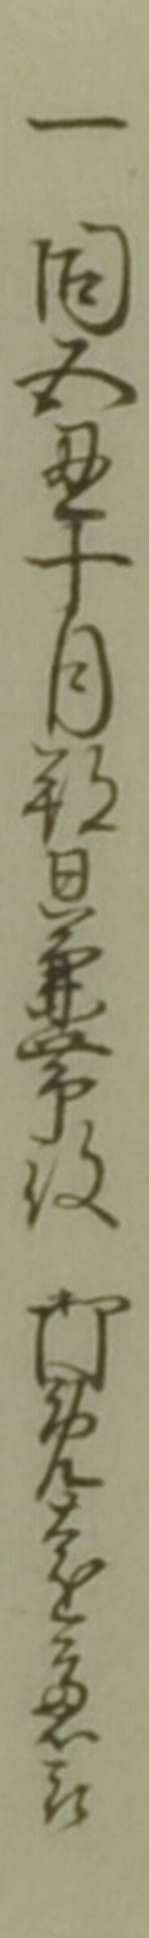一同五丑十月朔日兼帯役御免遠慮被
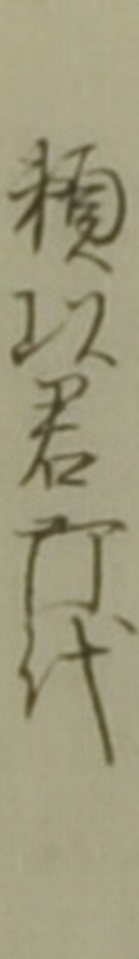頼以君御代
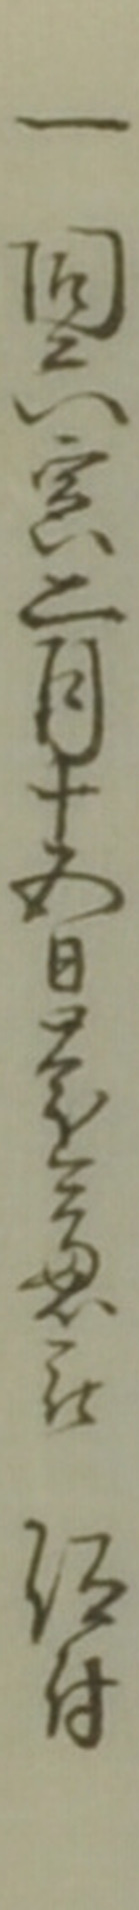一同六寅二月十五日遠慮被仰付
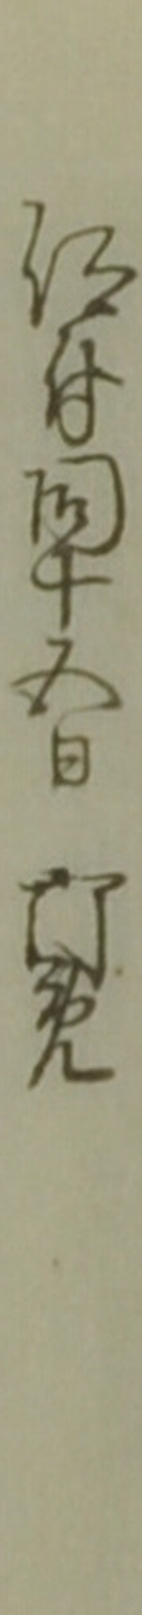仰付同十五日御免
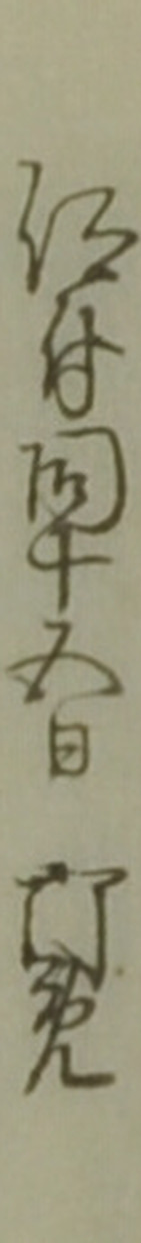仰付同十五日御免
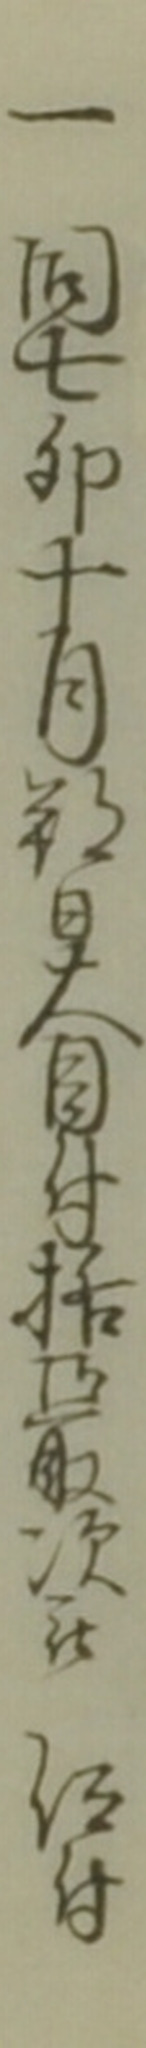一同七卯十月朔日大目付格御取次被仰付
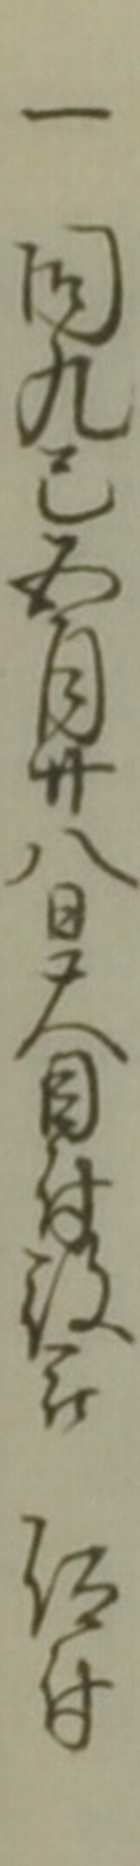一同九巳五月廿八日大目付役被仰付
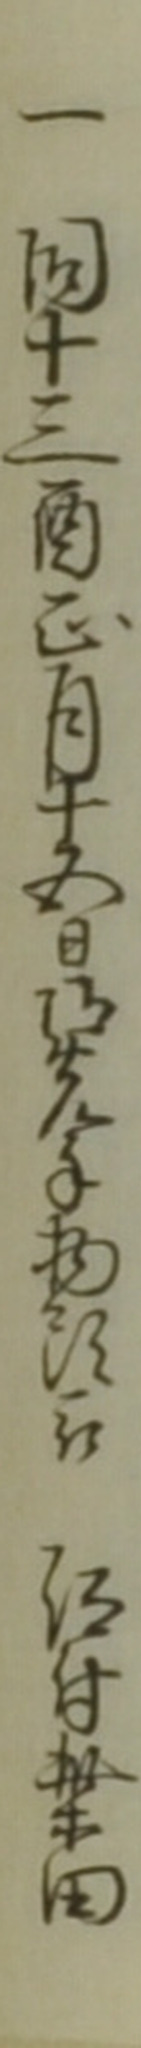一同十三酉正月十五日御先手物頭被仰付柴田
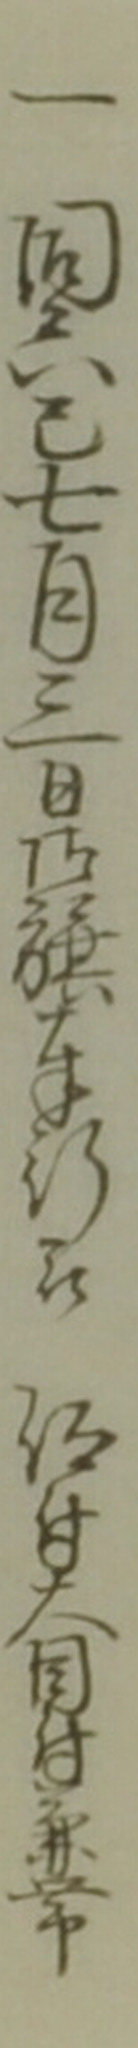一同六巳七月三日御旗奉行被仰付大目付兼帯
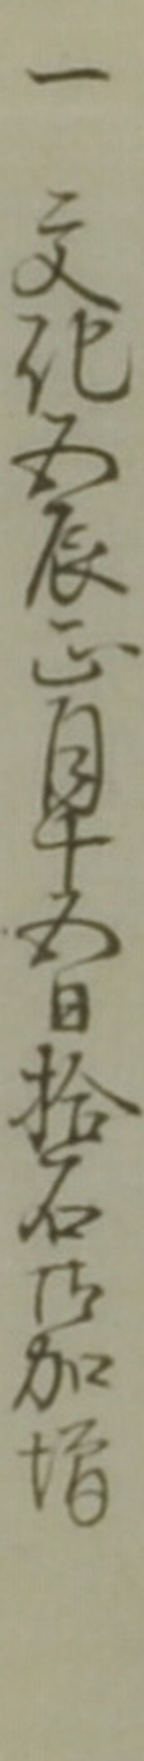一文化五辰正月十五日拾石御加増
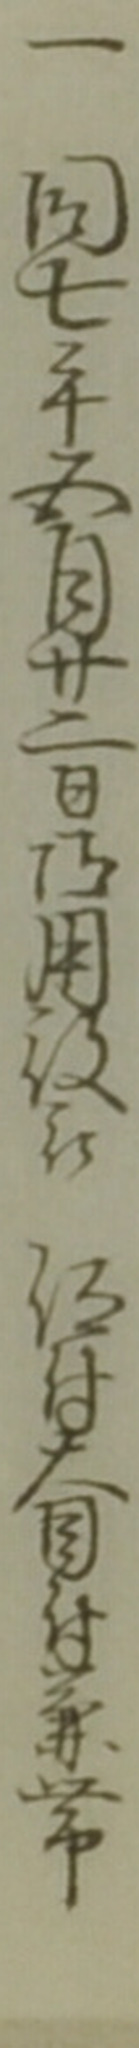一同七午五月廿二日御用役被仰付大目付兼帯
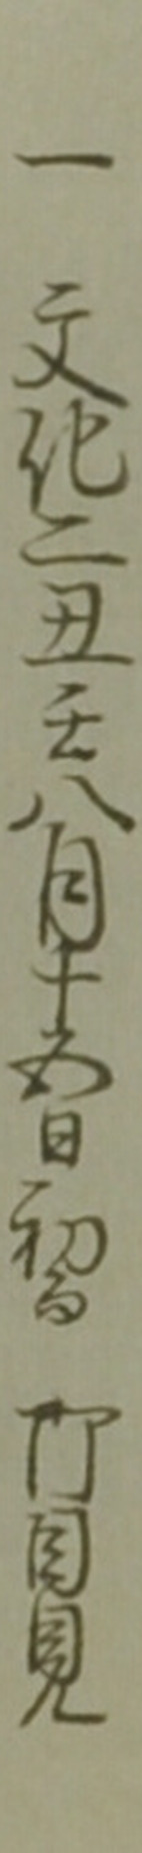一文化二丑閏八月十五日初而御目見
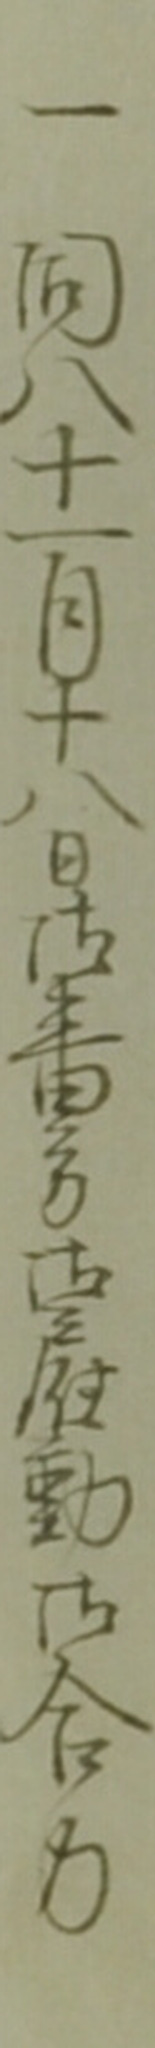一同八十一月十八日御番方御雇勤御合力
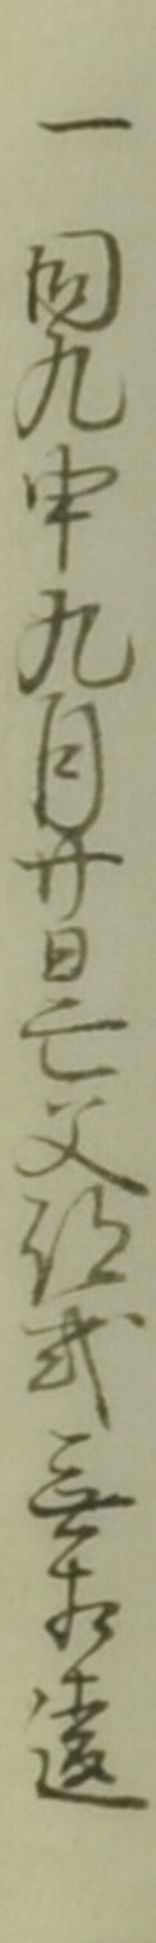一同九申九月廿日亡父跡式無相違

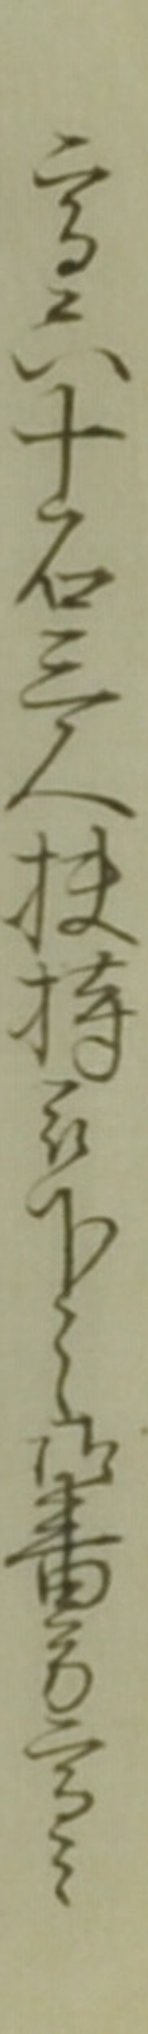高六十石三人扶持被下之御番方高之
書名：給人諸士勤仕録（三）
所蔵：伊那市立高遠町図書館・合同会社AMANE
